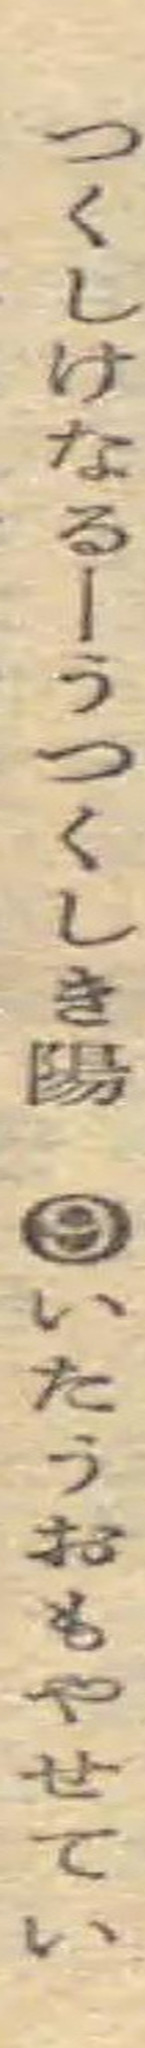つくしけなる―うつくしき陽❾いたうおもやせてい
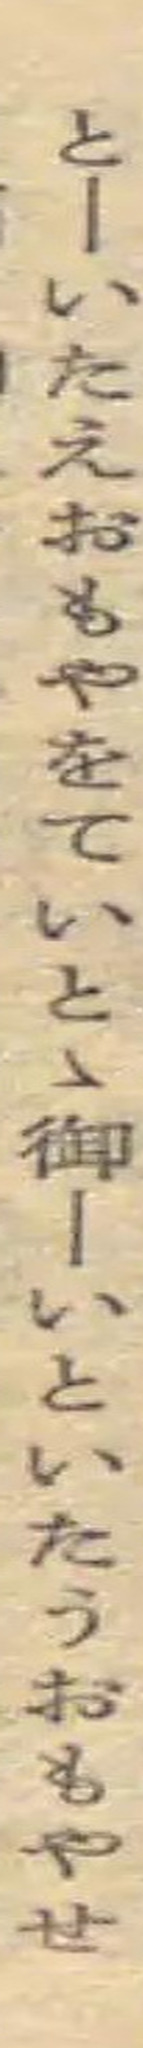と―いたえおもやをていとゝ御―いといたうおもやせ
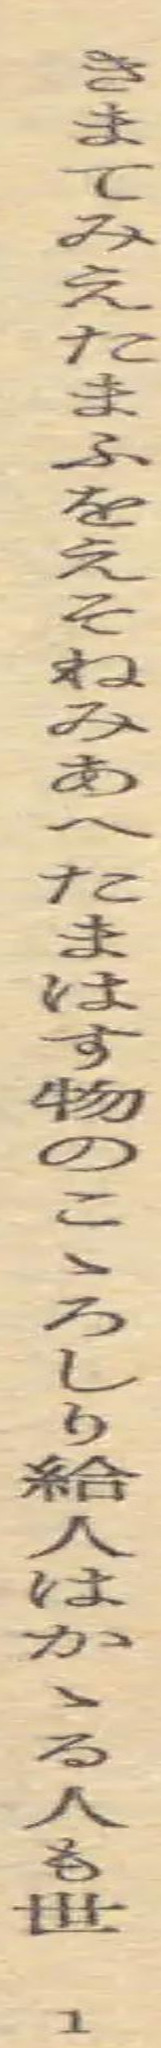きまてみえたまふをえそねみあへたまはす物のこゝろしり給人はかゝる人も世
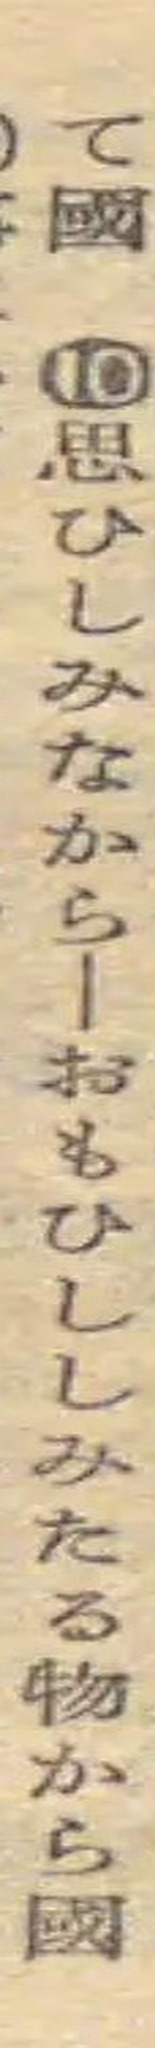て国❿思ひしみなから―おもひししみたる物から国
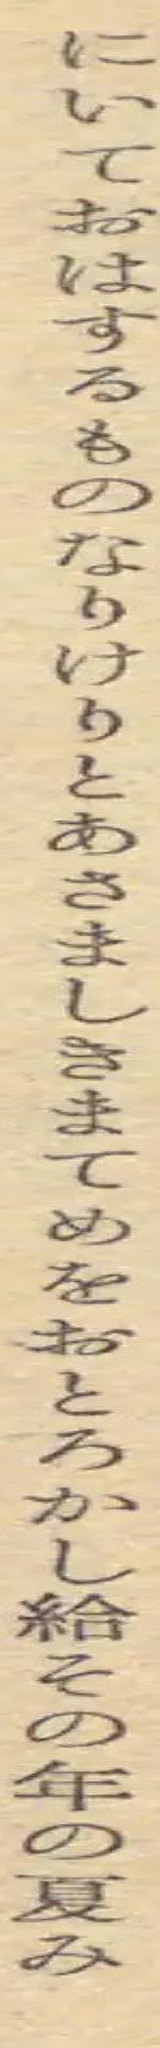にいておはするものなりけりとあさましきまてめをおとろかし給その年の夏み
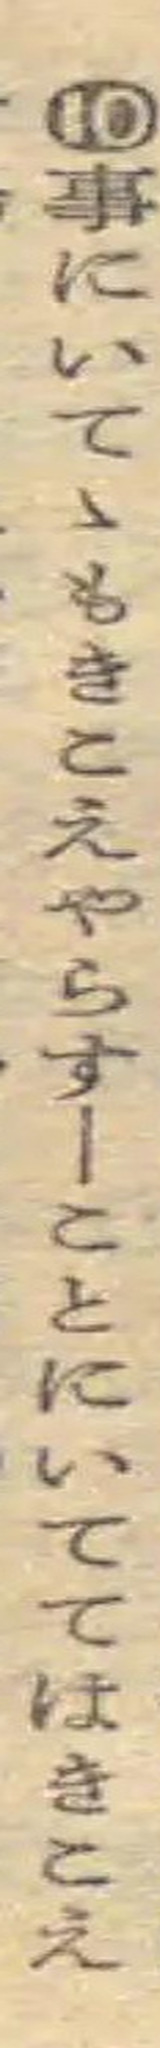❿事にいてゝもきこえやらす―ことにいててはきこえ
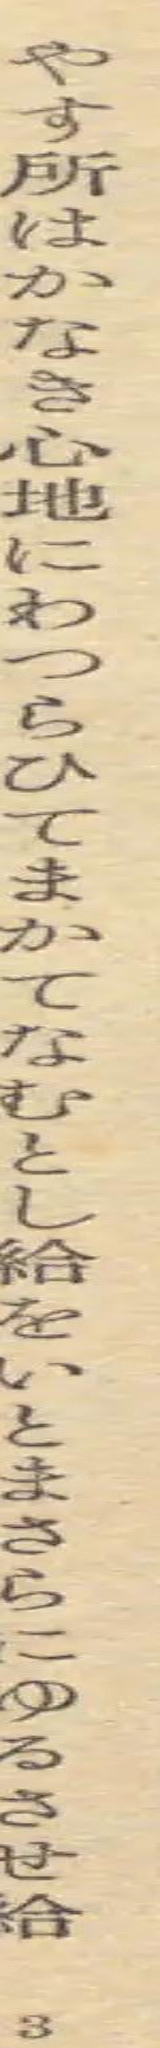やす所はかなき心地にわつらひてまかてなむとし給をいとまさらにゆるさせ給
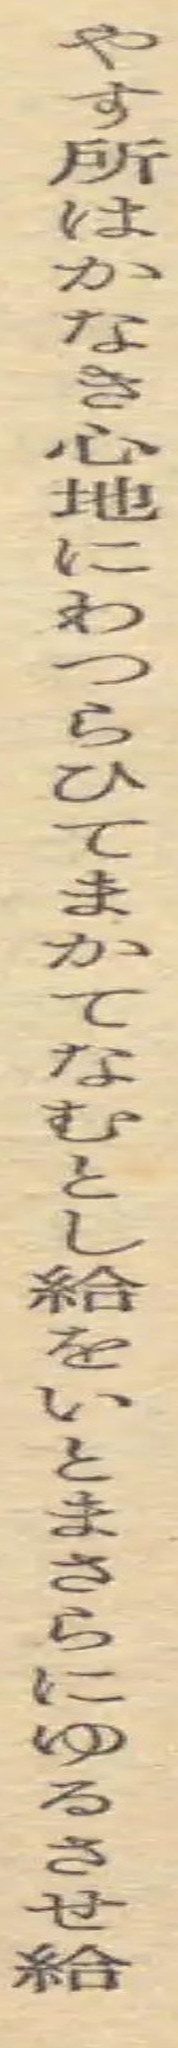やす所はかなき心地にわつらひてまかてなむとし給をいとまさらにゆるさせ給
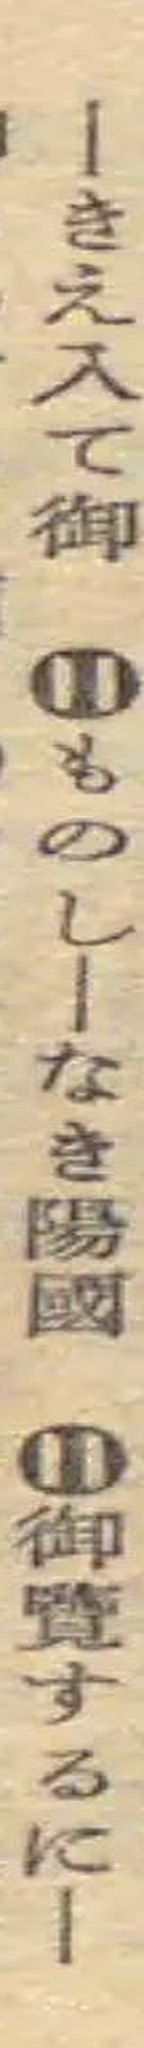―きえ入て御⓫ものし―なき陽国⓫御覧するに―
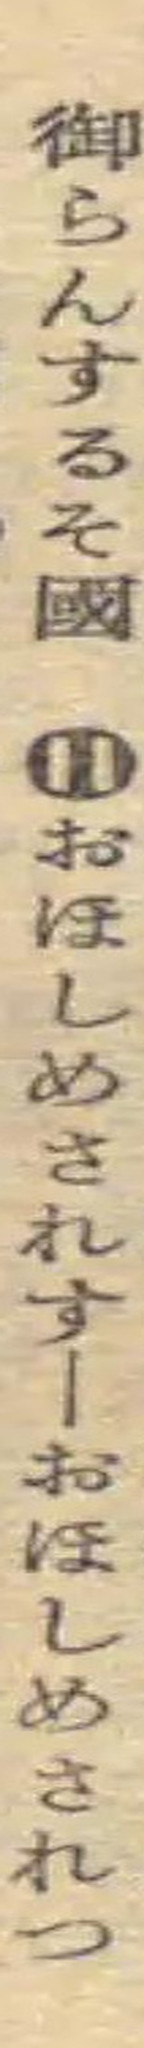御らんするそ国⓫おほしめされす―おほしめされつ
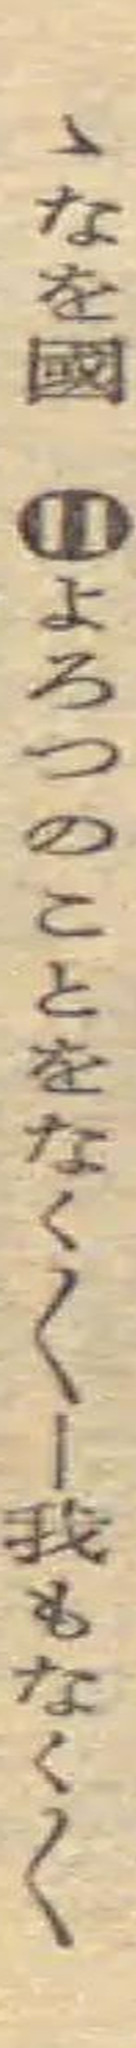ゝなを国⓫よろつのことをなく〳〵―我もなく〳〵
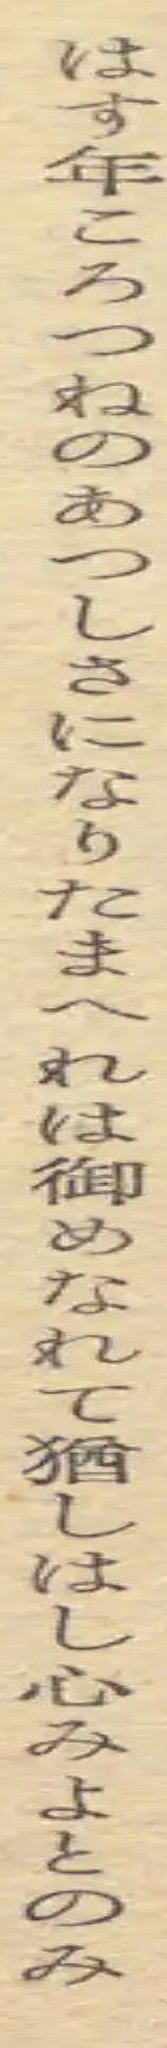はす年ころつねのあつしさになりたまへれは御めなれて猶しはし心みよとのみ
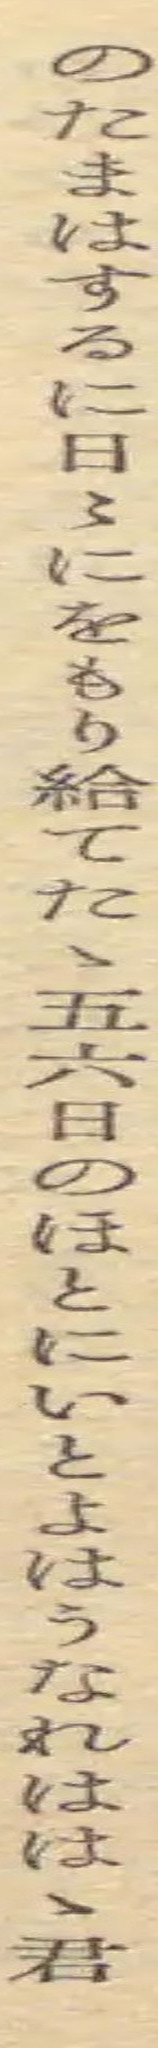のたまはするに日々にをもり給てたゝ五六日のほとにいとよはうなれははゝ君
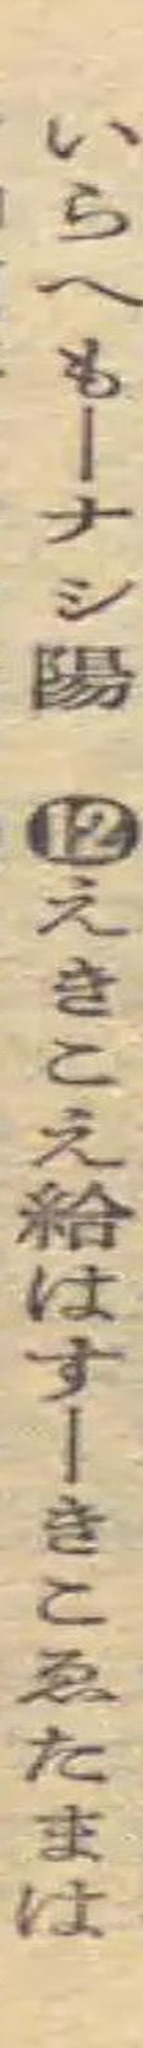いらへも―ナシ陽⓬えきこえ給はす―きこゑたまは
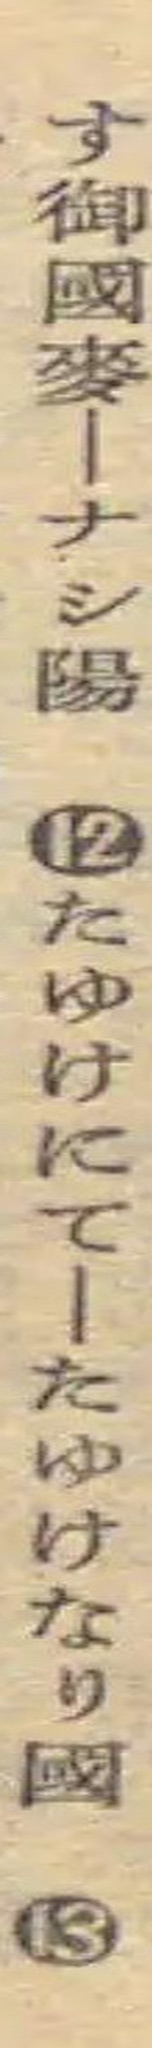す御国麦―ナシ陽⓬たゆけにて―たゆけなり国⓭
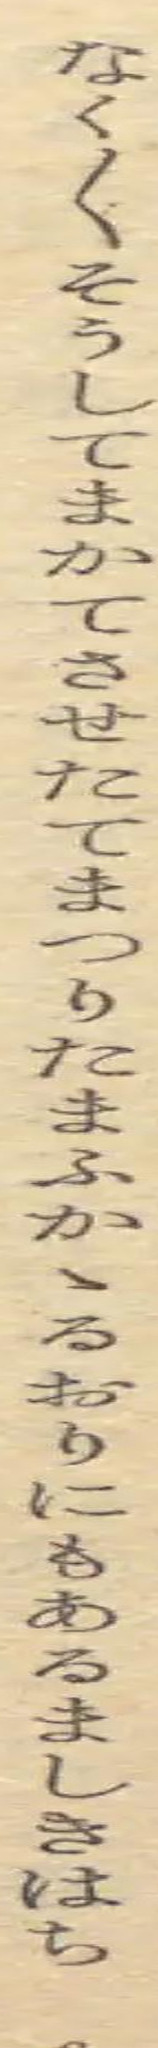なく〳〵そうしてまかてさせたてまつりたまふかゝるおりにもあるましきはち
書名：校異源氏物語.
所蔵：国立国会図書館 National Diet Library, JAPAN
